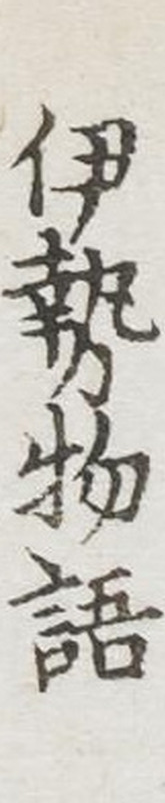伊勢物語
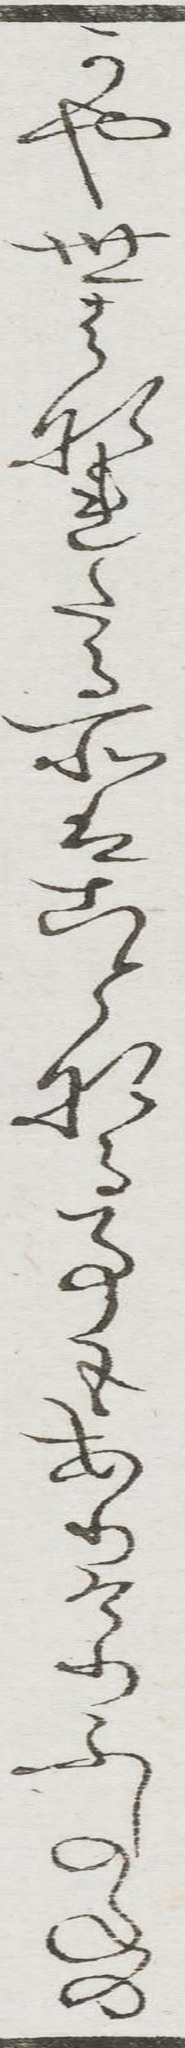かや世はなれたる所はことなる事もありけりふしのねの
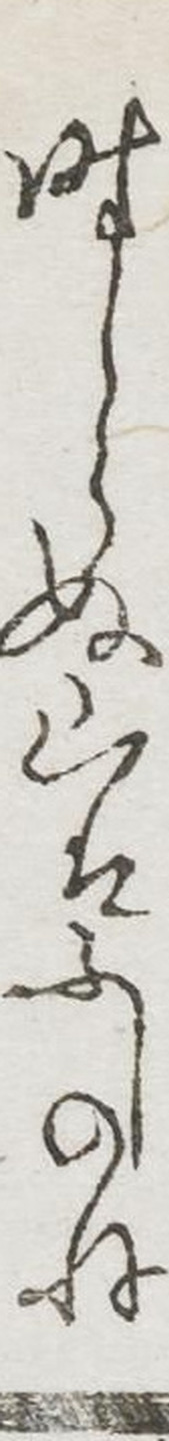時しらぬ山はふしのね
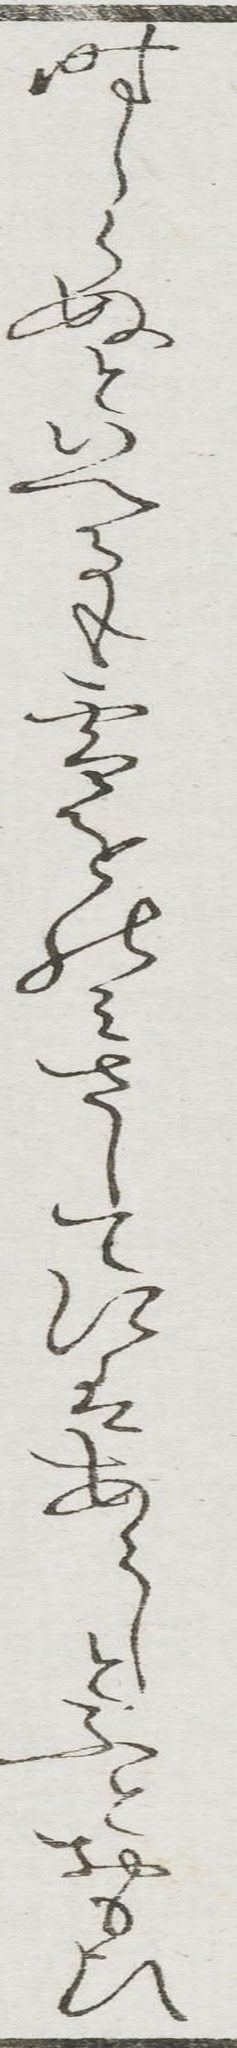時しらぬといへるも雪をのみさしてにはあらしとふとおもひ
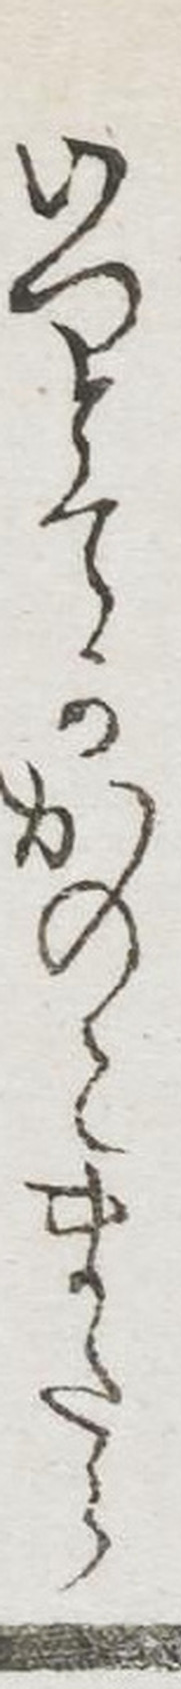いつとてかかのこまだら
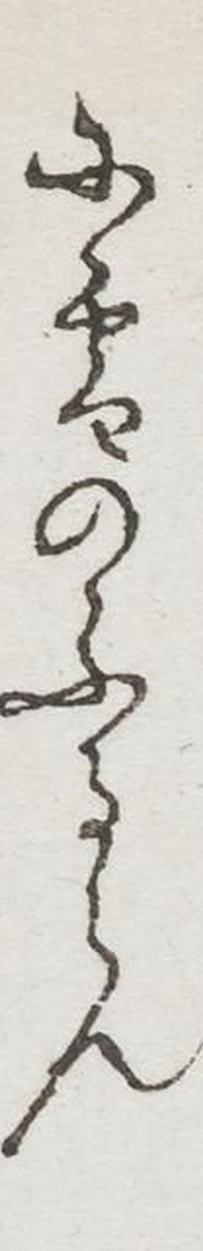に雪のふるらむ
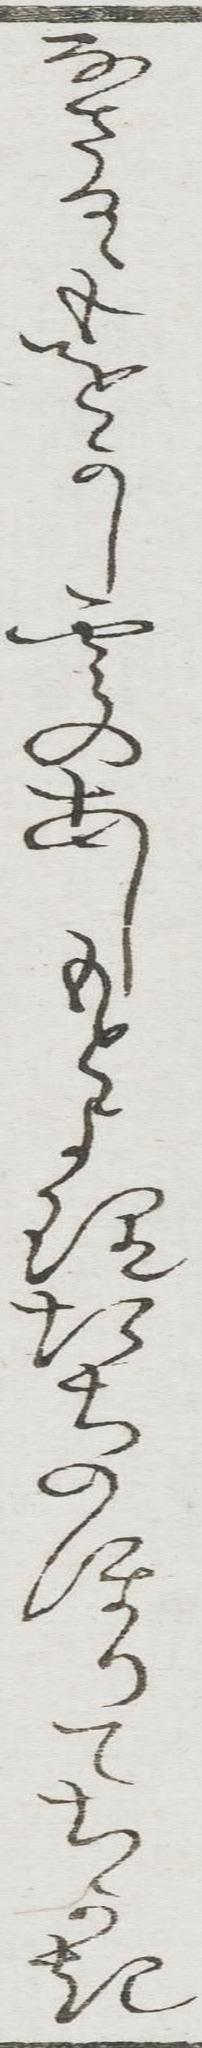なさるゝもをかし雲のあしもとよりたちのほりてちかき
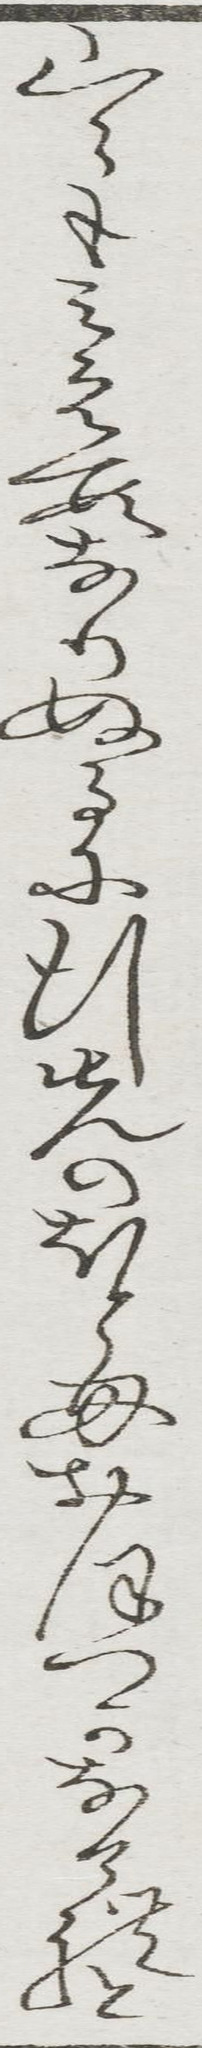山々にもみえすなりぬるに行先のほともおほつかなけれと
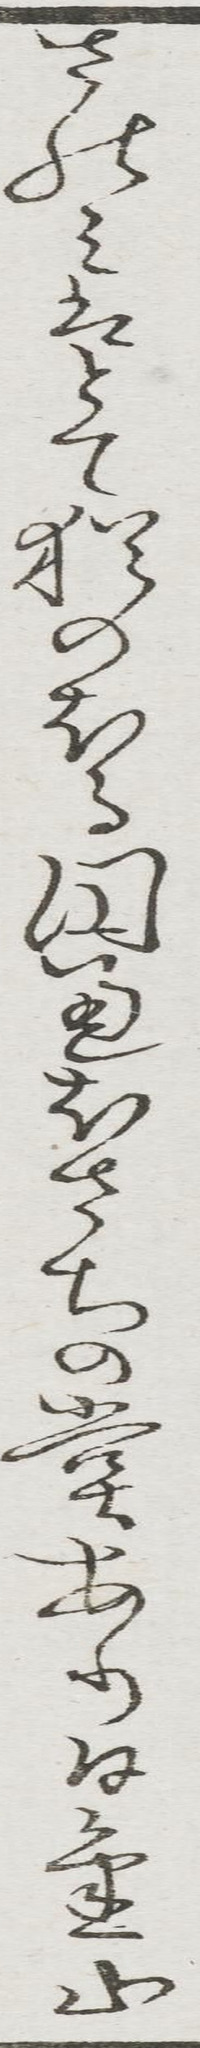さのみはとて猶のほる円通ほさちの堂あり日金山
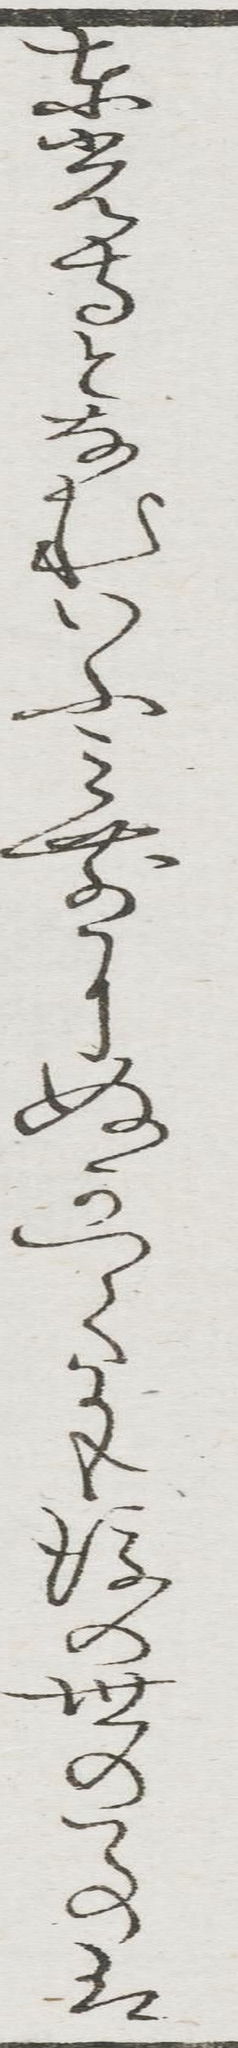東光寺となむいふみ前にぬかつくにも後の世の事は
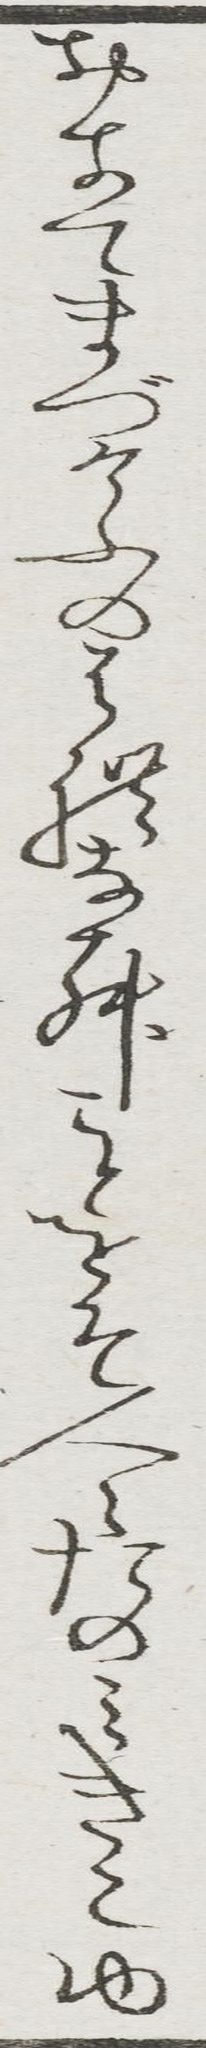おきてまづけふのはれなむことをそ人々たのみきこゆ
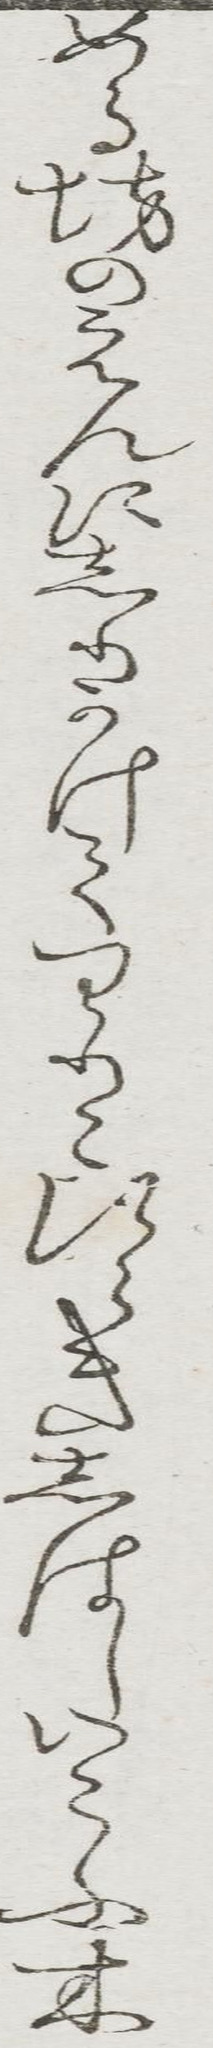める坊のえんにしりかけてわりこひらきしはしいこふ木
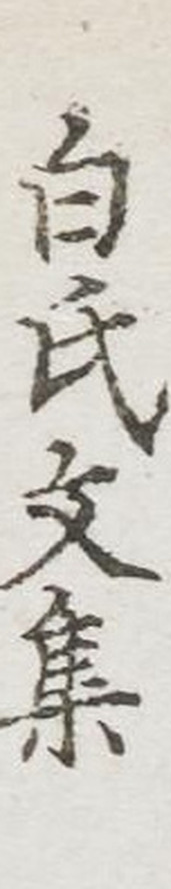白氏文集
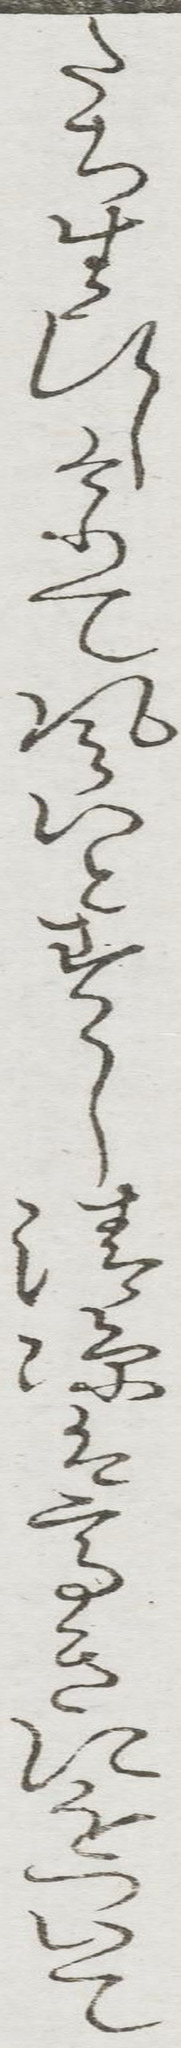たち生ひしけりて風いとすゝし清涼は高きに近ついて
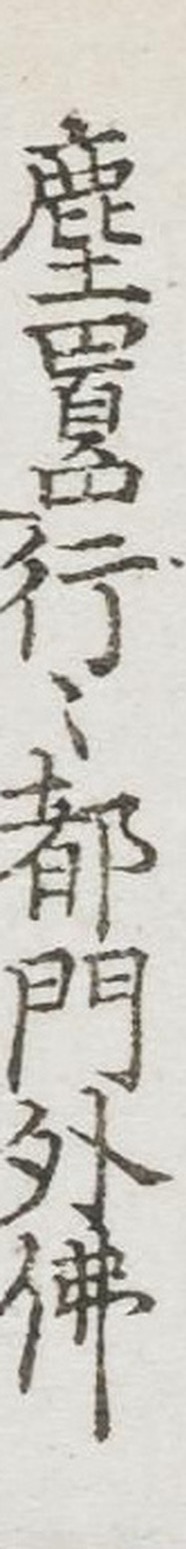塵囂行〻都門外仏
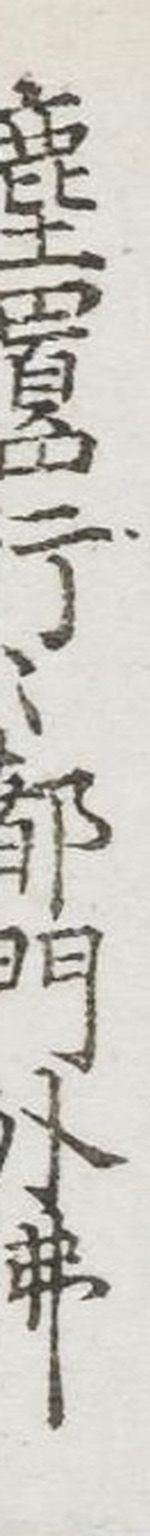塵囂行〻都門外仏
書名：挿画熱海日記　全
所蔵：東京大学地震研究所図書室 Earthquake Research Institute Library, The University of Tokyo, JAPAN
